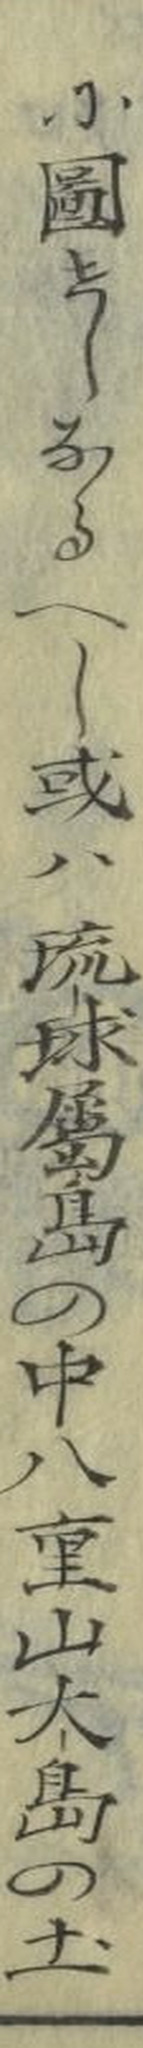に図せしなるへし或は琉-球属-島の中八重山大-島の土
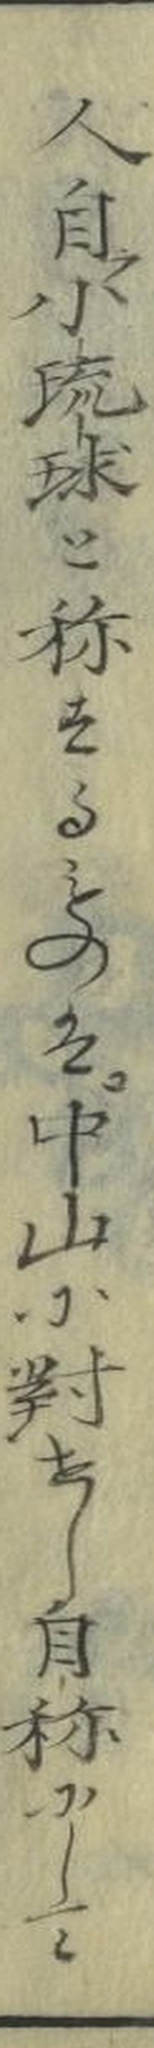人自小-琉-球と称するものは。中山に対せし自-称にして

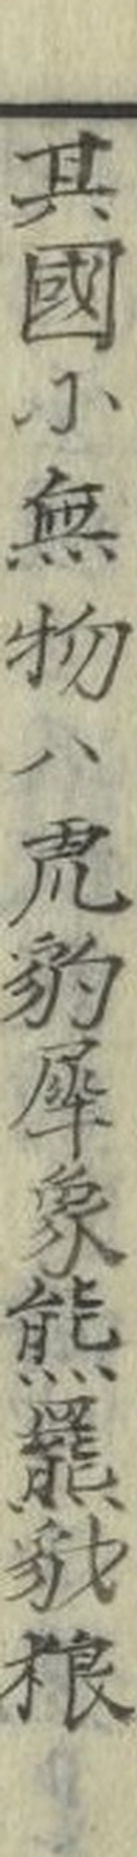其国に無物は虎票豹犀象熊羆豺狼
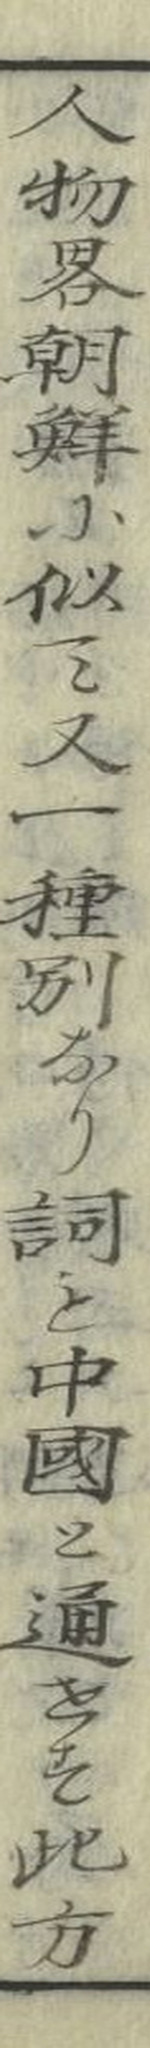人物略朝鮮に似て又一種別なり詞も中国と通せす此方
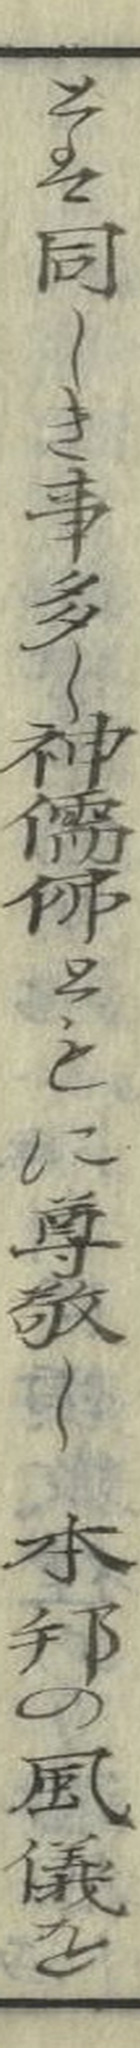とは同しき事多し神儒佛ともに尊敬し本邦の風儀を
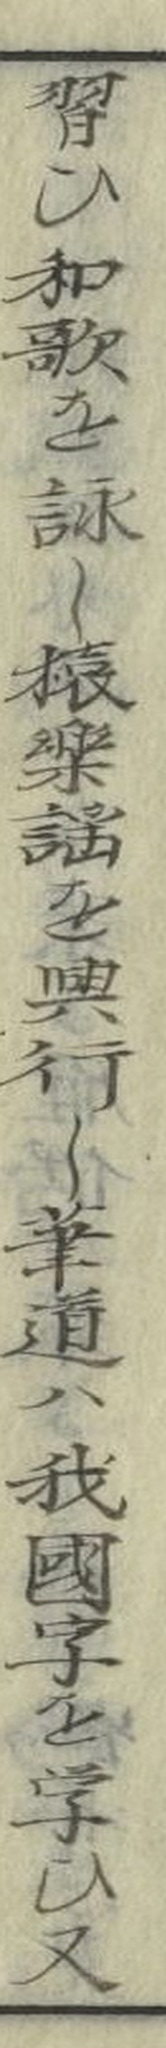習ひ和歌を詠し猿楽謡を興行し書道は我国字を学ひ又
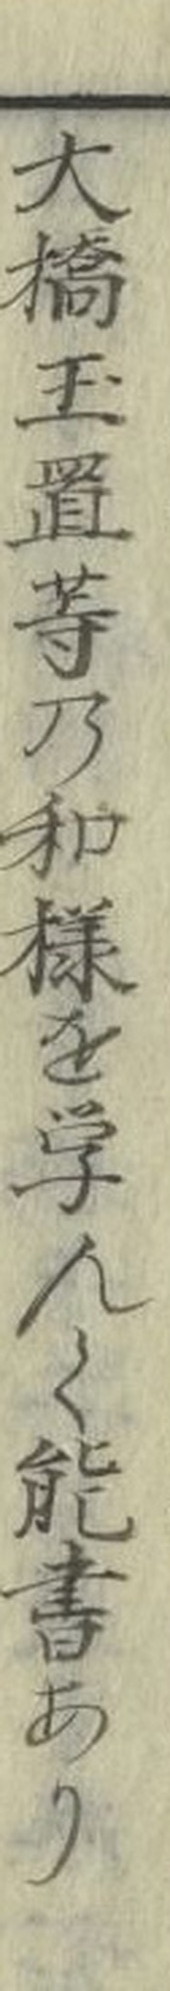大橋玉置等の和様を学んて能書あり
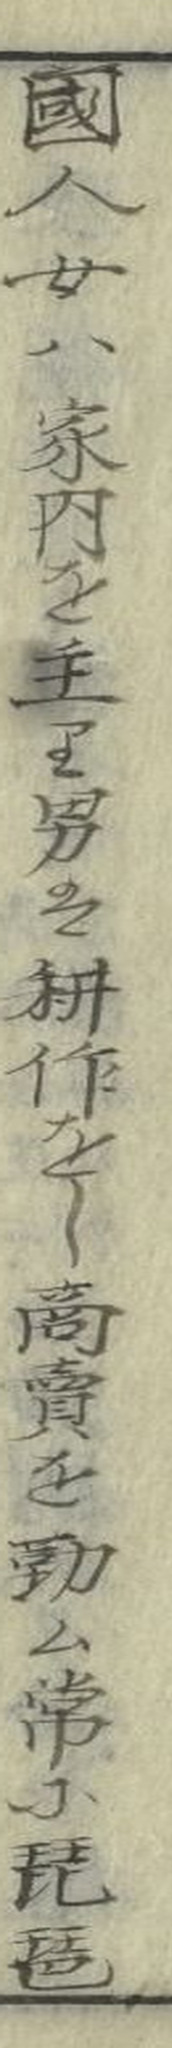国人女は家内を主り男は耕作をし商売を勤む常に琵琶
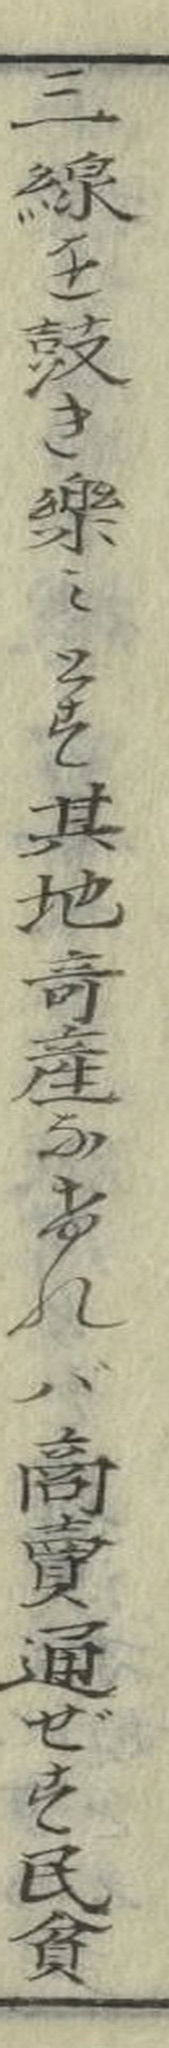三線を鼓き楽みとす其地奇産なければ商売通ぜす民貧
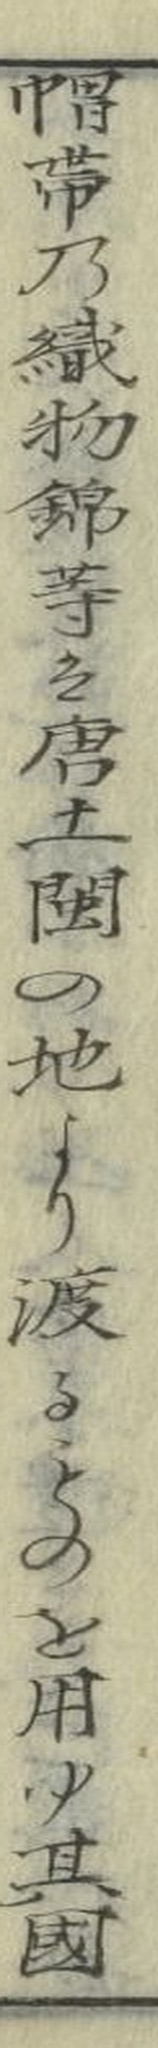帽帯の織物錦等は唐土閩の地より渡るものを用ゆ其国
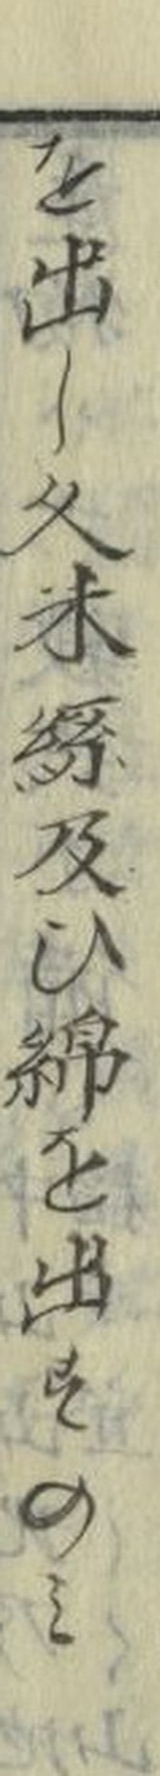を出し久米糸及ひ綿を出すのみ
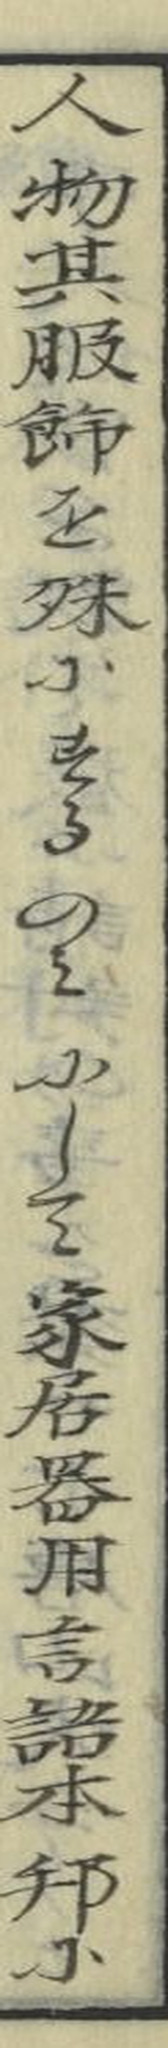人物其服飾を殊にするのみにして家居器用言語本邦に
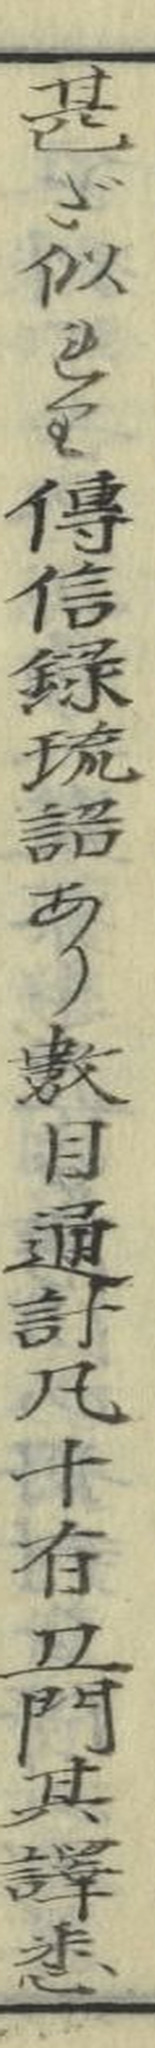甚だ似れり伝信録琉語あり数目通計凡十有五門其訳悉
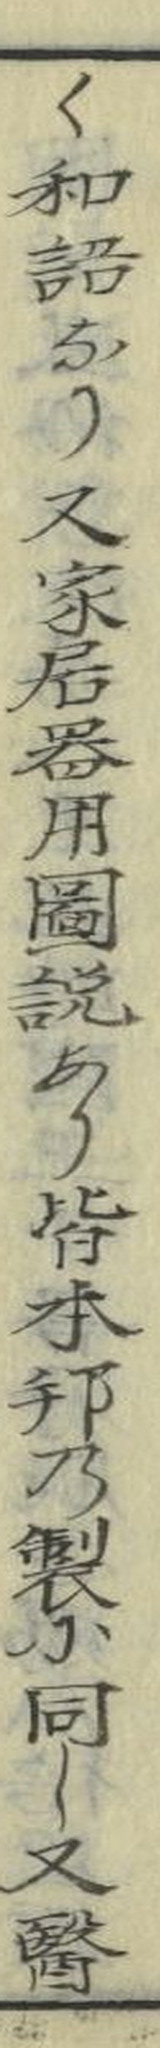く和語なり又家居器用図説あり皆本邦の製に同し又医
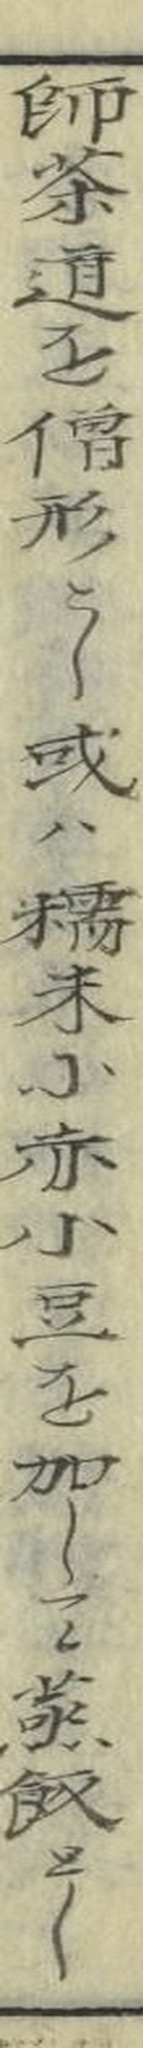師茶道を僧形とし或は糯米に亦小豆を加して蒸飯とし
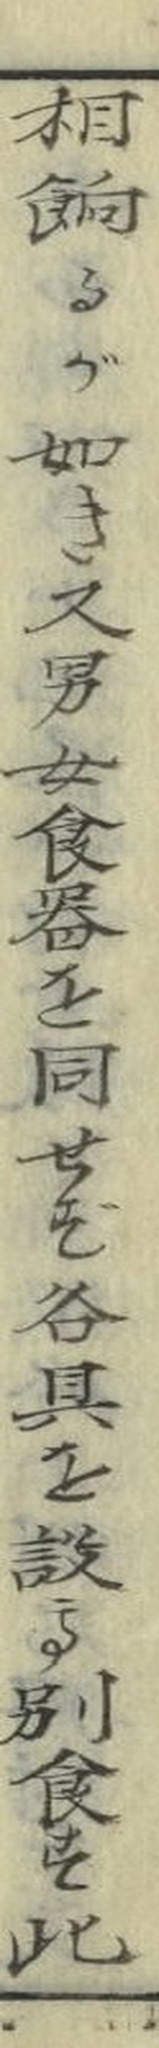相餉るが如き又男女食器を同せず各具を設て別食す此
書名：琉球沿革志 上
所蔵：University of the Ryukyus Library
